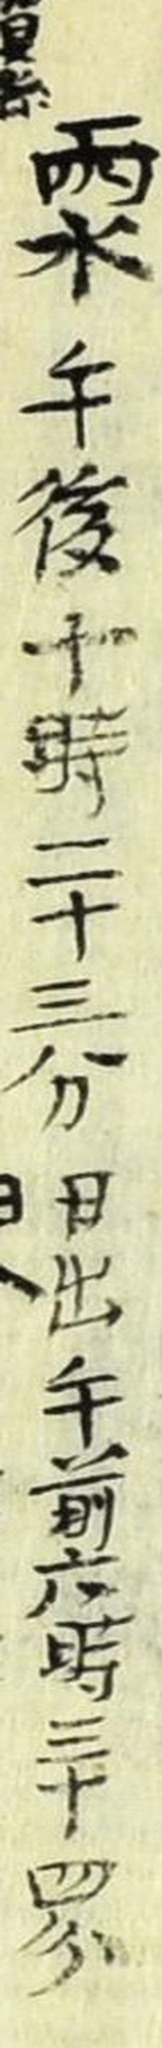雨水午後十時二十三分日出午前六時三十四分
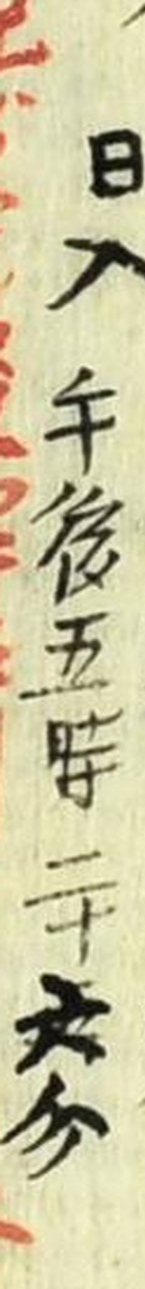日入午後五時二十六分
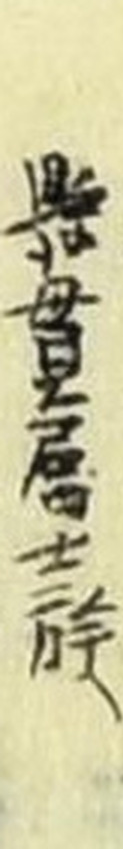県貫属士族
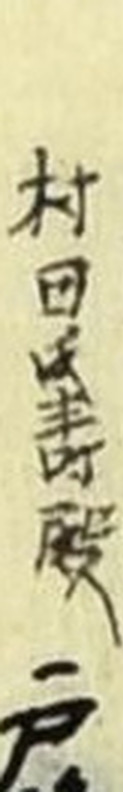村田氏寿殿
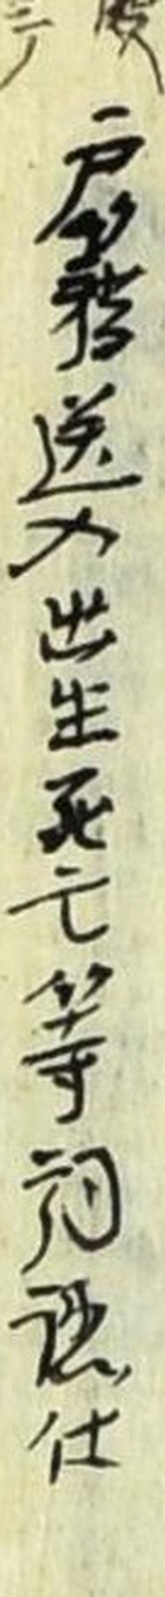戸籍送入出生死亡等調認仕
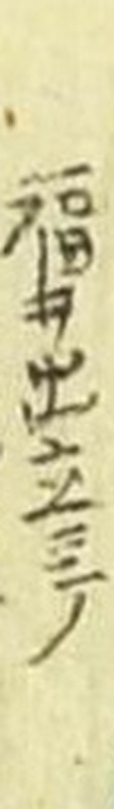福井出立ニテ
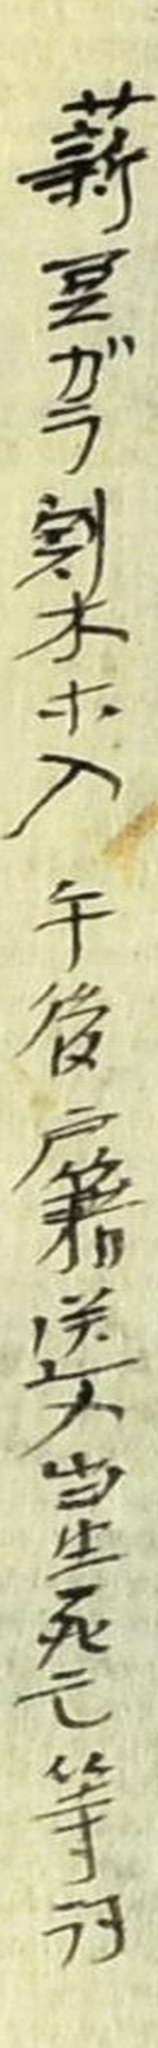薪豆ガラ割木等入午後戸籍送入出生死亡等調
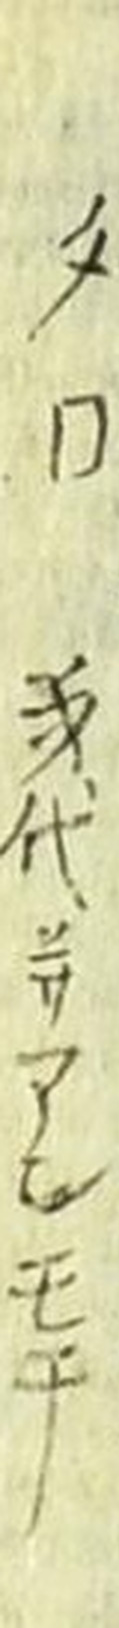夕同幾代幷アンモチ
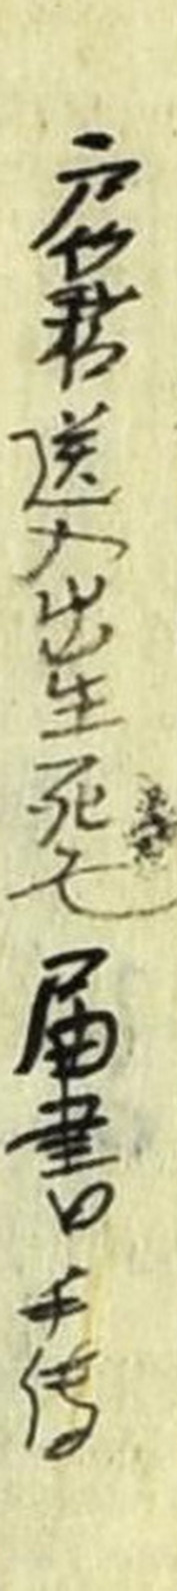戸籍送入出生死亡届書手伝
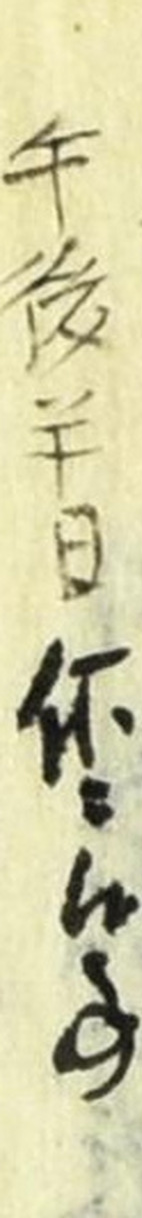午後半日休ニ候事

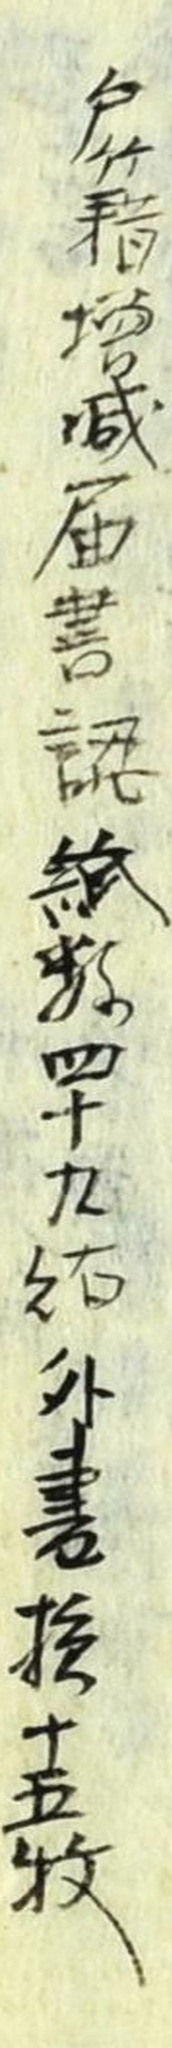戸籍増減届書認紙数四十九賄外書損十五枚
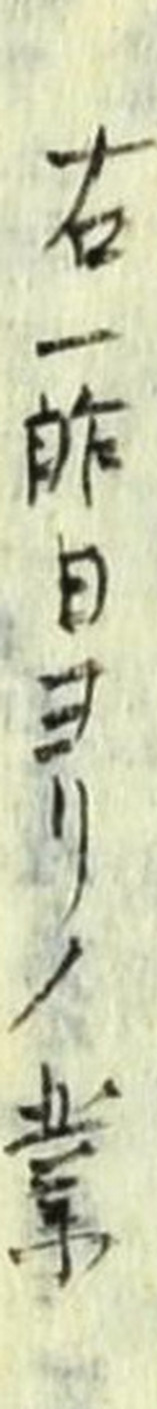右一昨日ヨリノ業
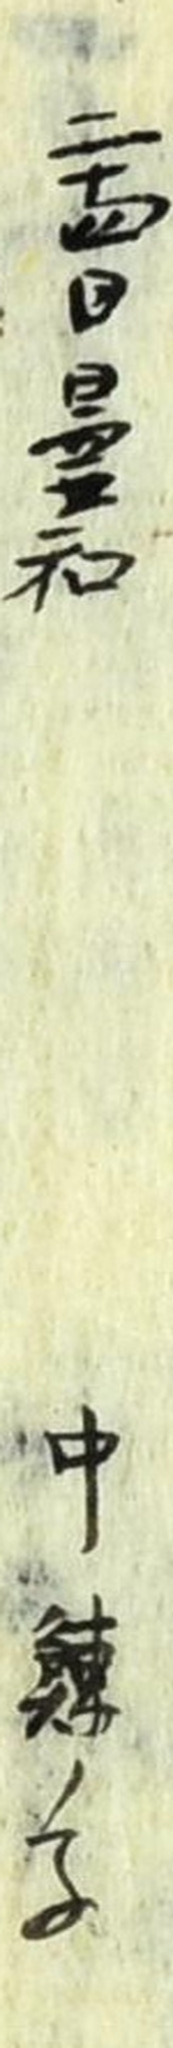二十四日曇和中鰊ノ子
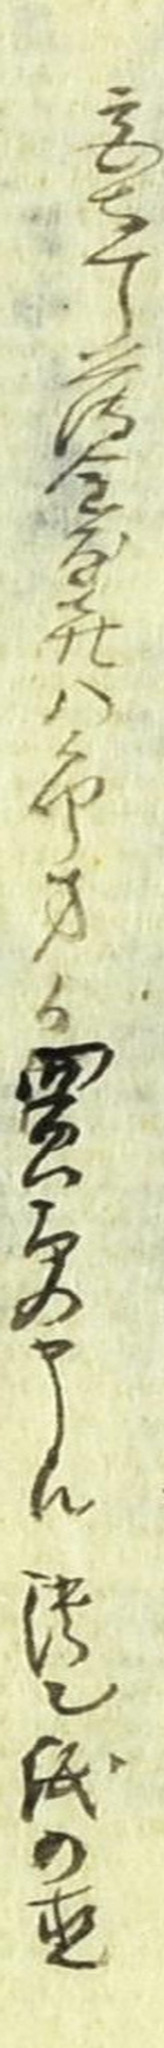宮寺丁薄金屋喜八郎方ゟ買受申候潰シ紙の直
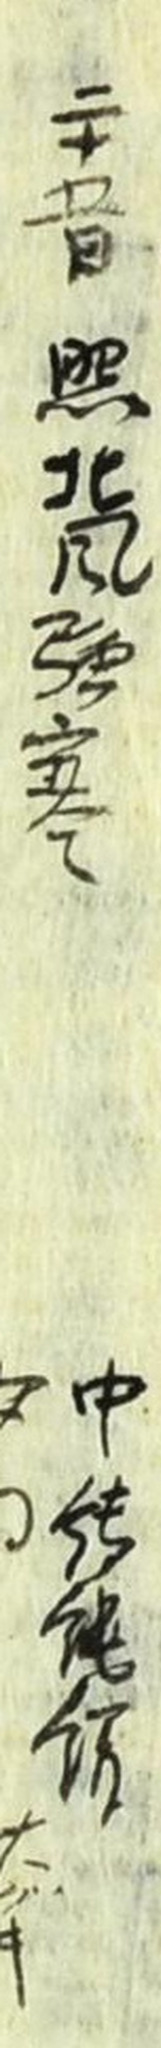二十五日照北風強寒中餺飩餅
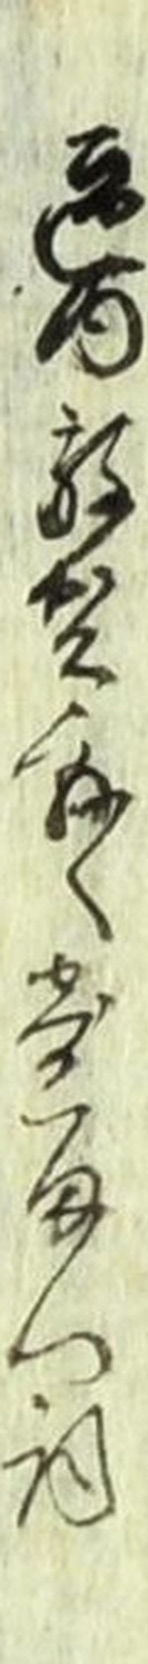区内敦賀県へ寄留人調
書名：（日記）
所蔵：福井県文書館 Fukui Prefectural Archives
